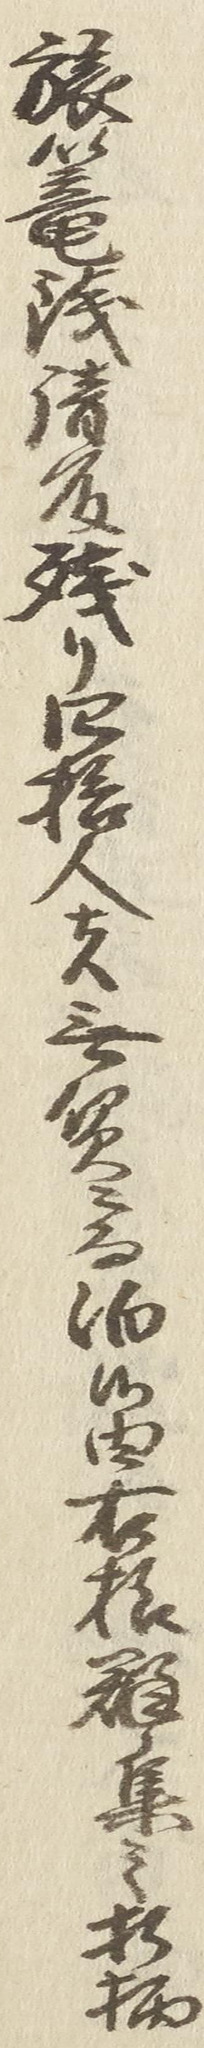は旅籠銭請取残り四拾人は無賃二而泊候由右様群集之折柄
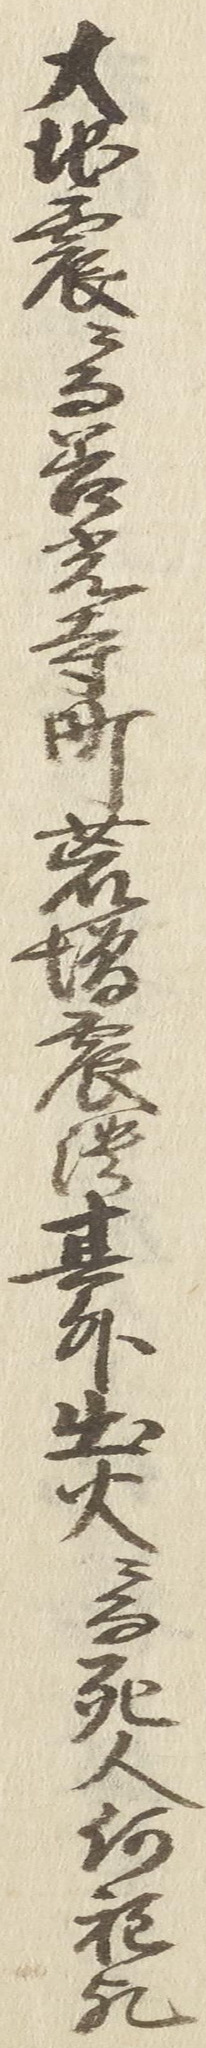大地震二而善光寺町荒増震潰其外出火二而死人何程歟

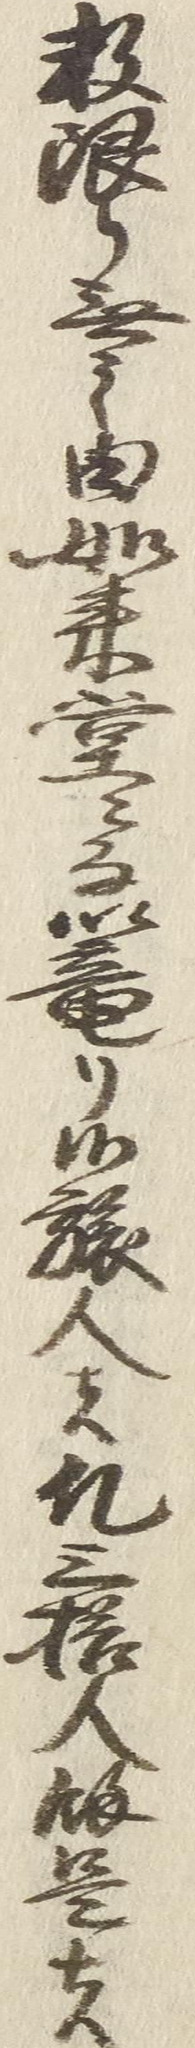数限り無之由如来堂二而御籠り候旅人凡三拾人餘是は
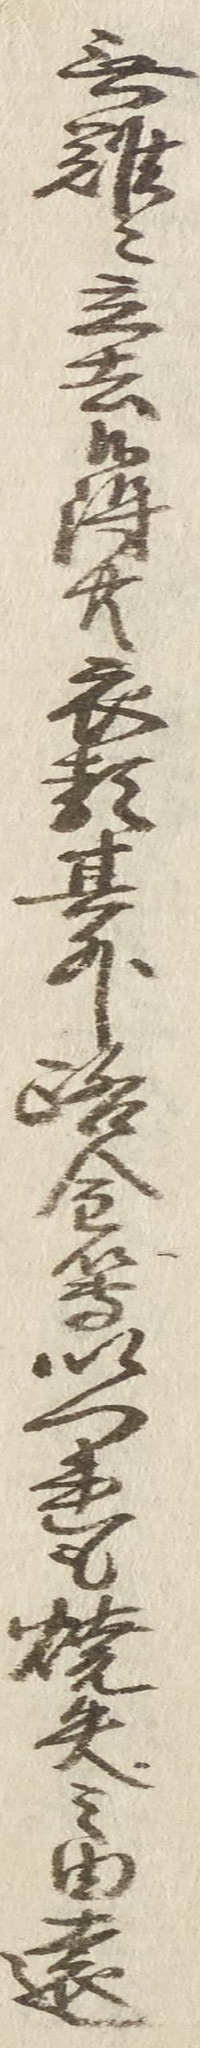無難二立去候得共衣類其外路金等いつも焼失之由遠
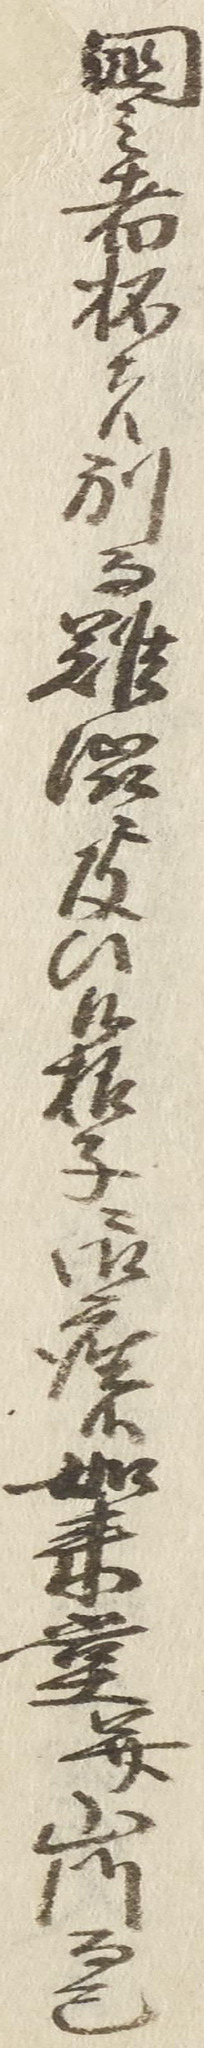国之者抔は別而難渋二及ひ候様子二御座候如来堂并山門而已
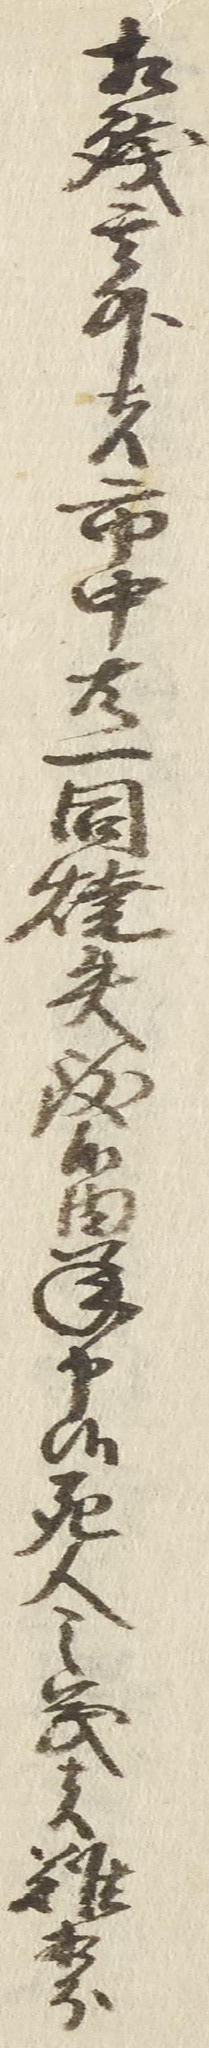相残其外は市中共一同焼失致候由承申候死人之儀は難相分
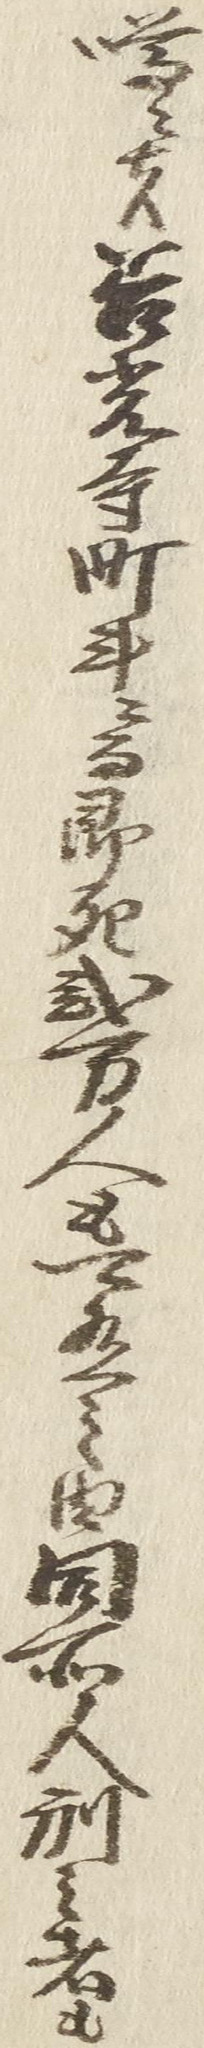噂二は善光寺町斗二而即死人弐万人も可有之候由同所人別之者も
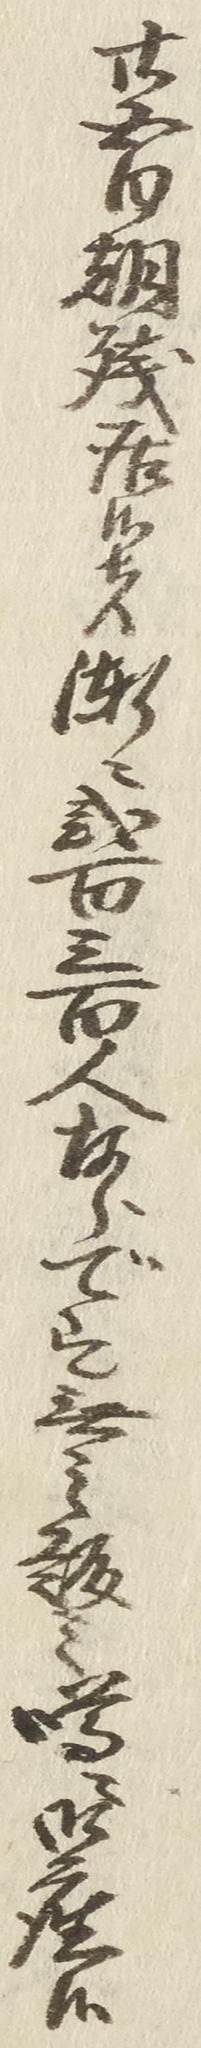廿五日朝残居候者漸々弐壱百三百人ならでは無之趣之噂二御座候
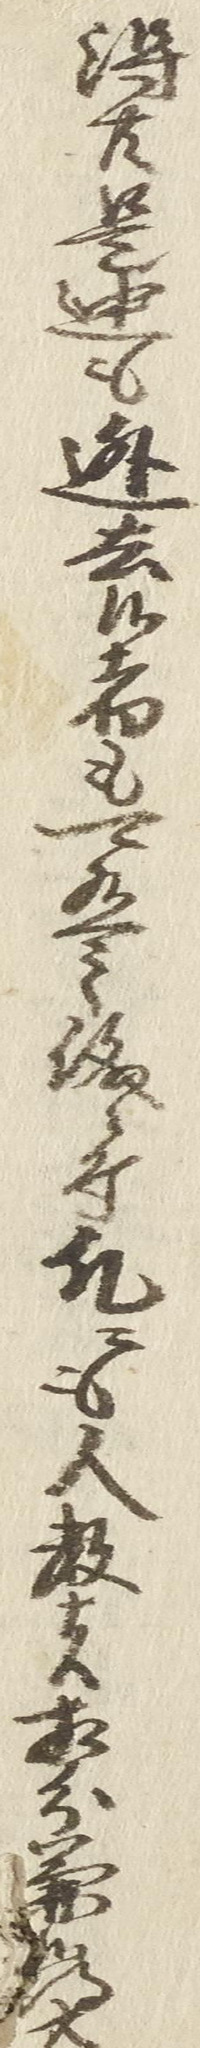得共是迚も逃去候者も可有之儀二付凡二も人数は相分兼候得共
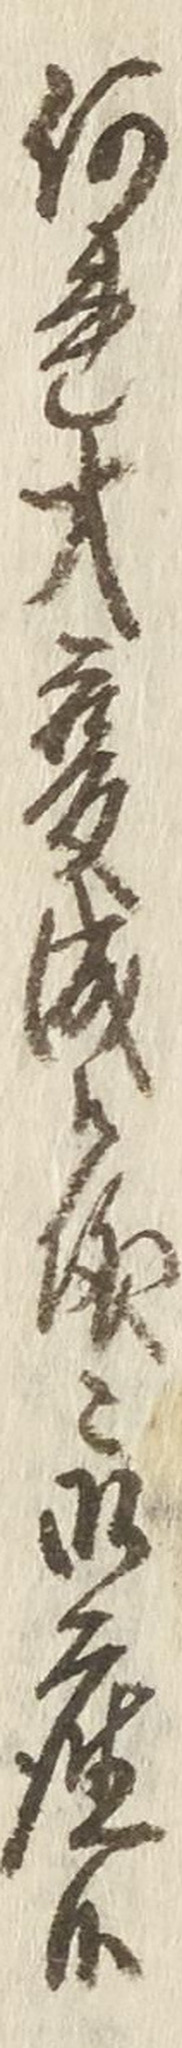何れ大変成候儀二御座候
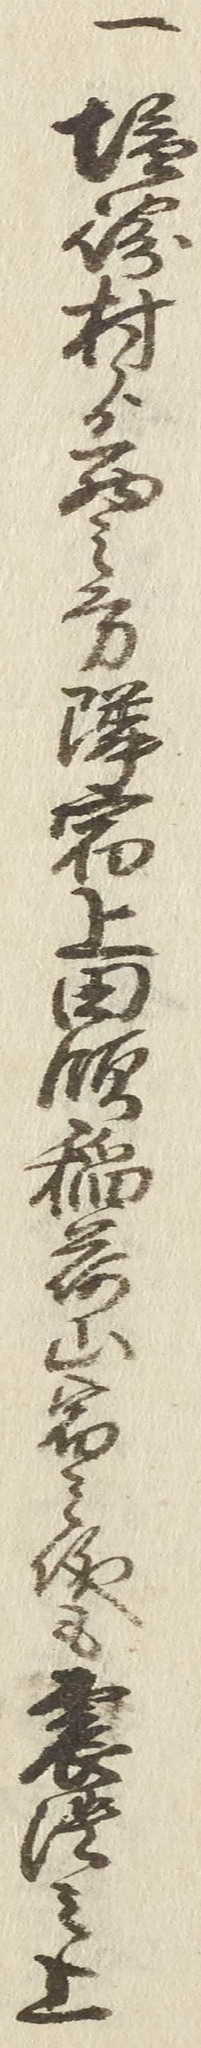一塩崎村ゟ西之方隣宿上田領稲荷山宿之儀も震潰候上
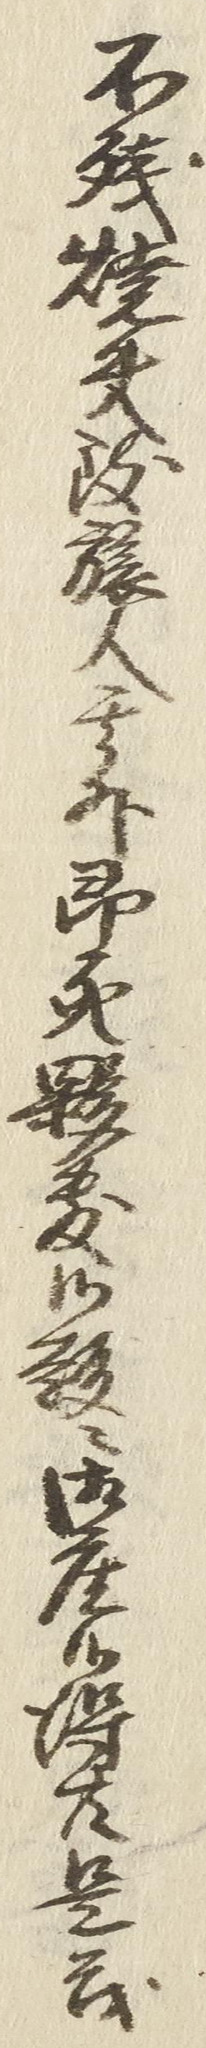不残焼失致旅人其外即死夥敷候趣二御座候得共是も
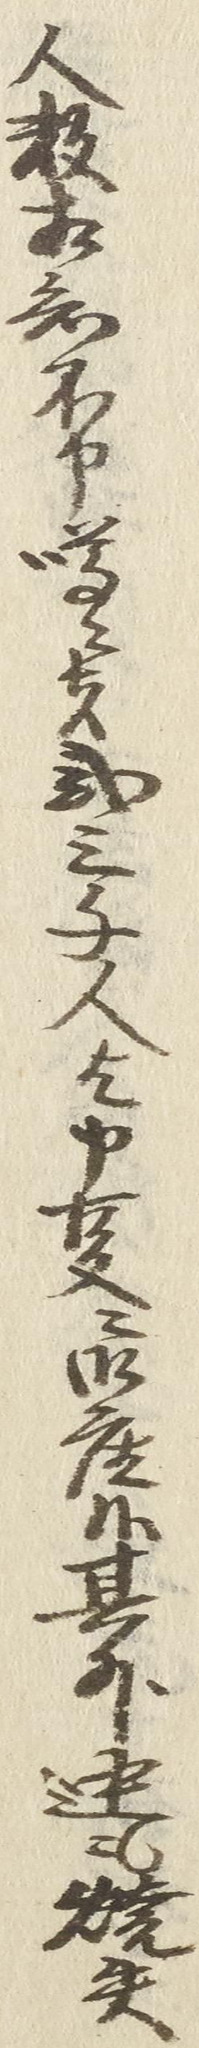人数相知不申噂二は弐三千人と申事二御座候其外迚も焼失
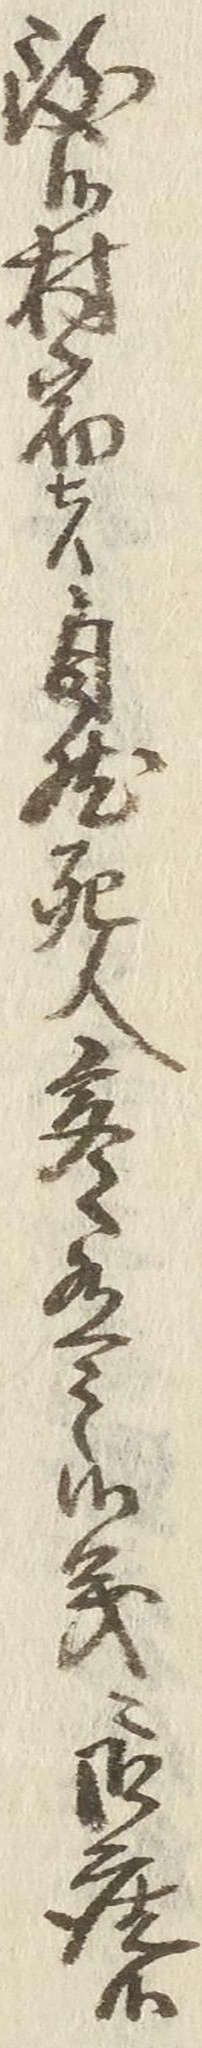致候村宿は自然死人多く有之候義二御座候
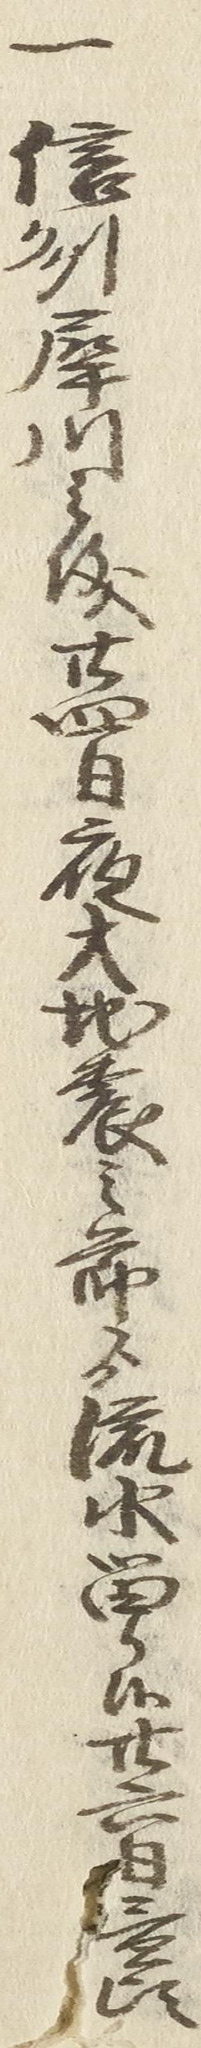一信州犀川之儀廿四日夜大地震之節ゟ流水留り候廿六日昼頃
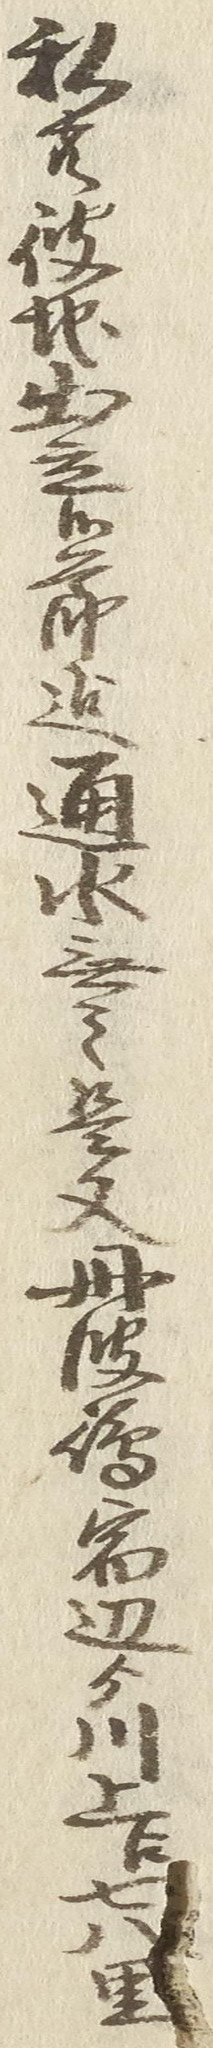私共彼之地出立候節迄通水無之是迄又丹波嶋宿辺ゟ川上江七八里
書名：従往古地震御届書記誌之一
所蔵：東京大学地震研究所図書室 Earthquake Research Institute Library, The University of Tokyo, JAPAN
